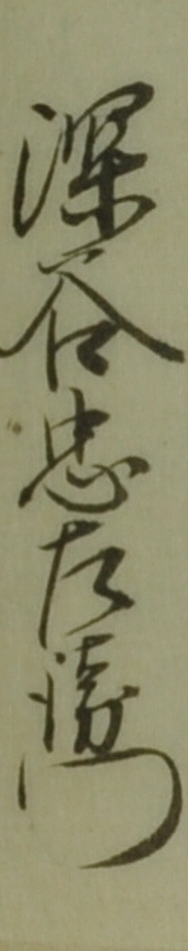深谷忠左衛門
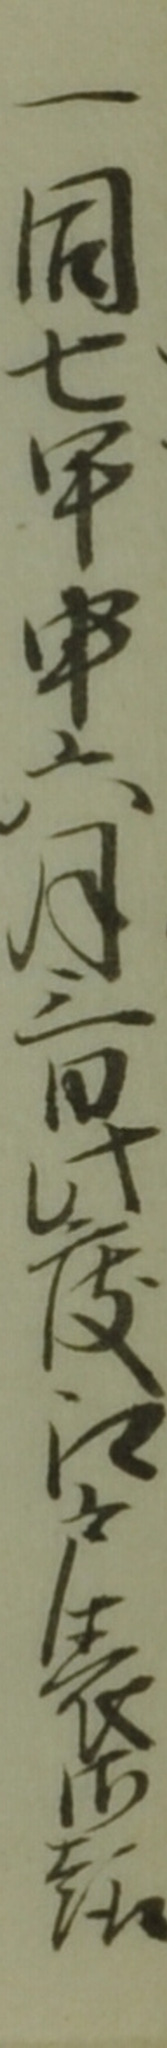一同七甲申六月三日此度江戸表御趣
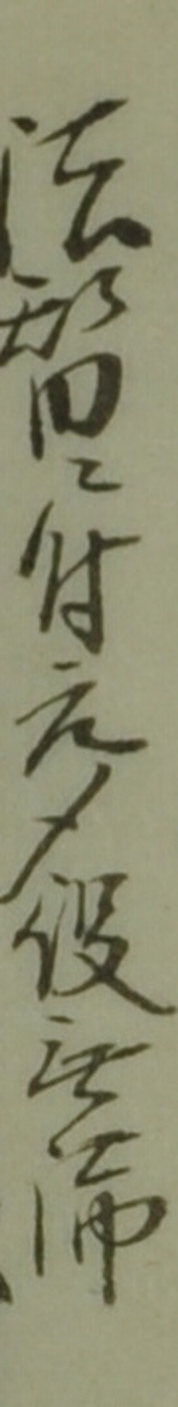法替付元〆役無滞
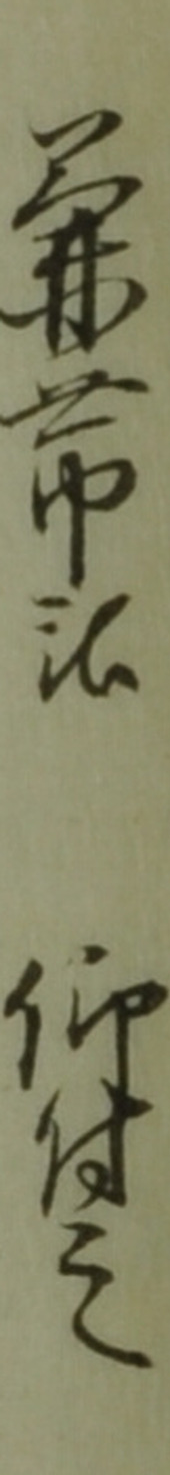兼帯被仰付之
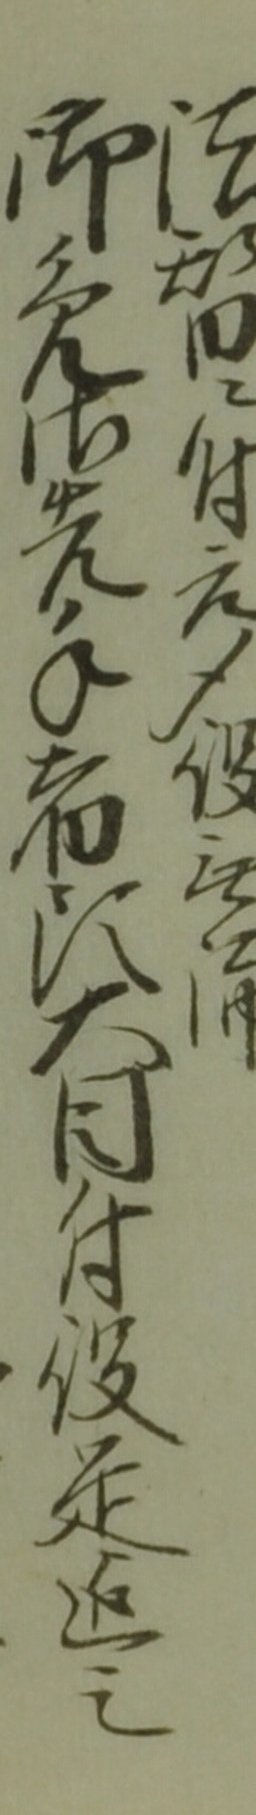御免御先手者頭大目付役是迄之
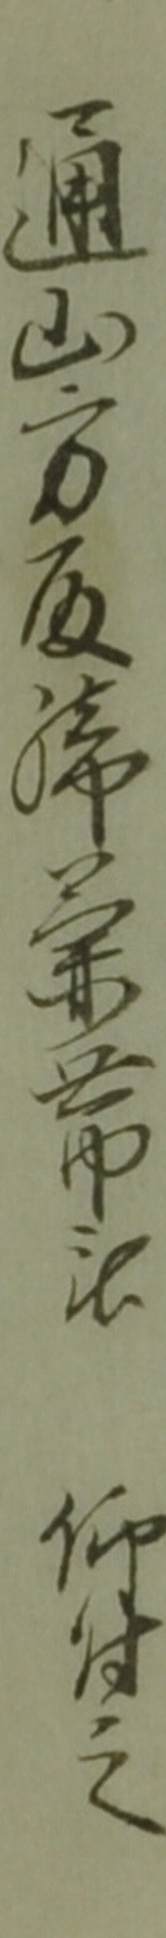通山方取締兼帯被仰付之
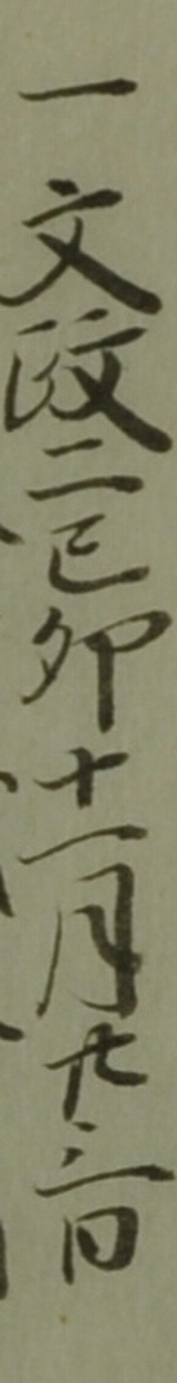一文政二己卯十一月廿三日
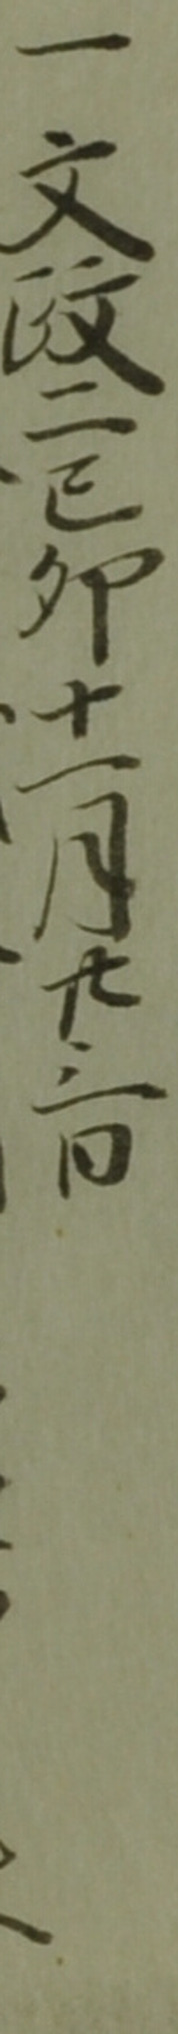一文政二己卯十一月廿三日
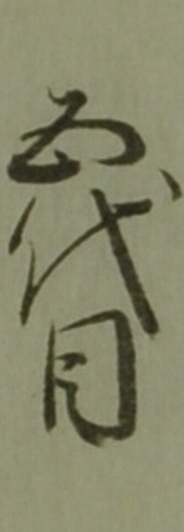五代目
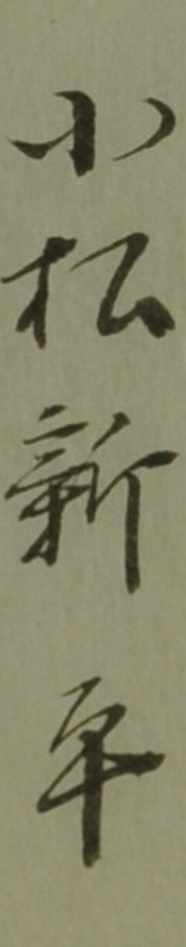小松新平
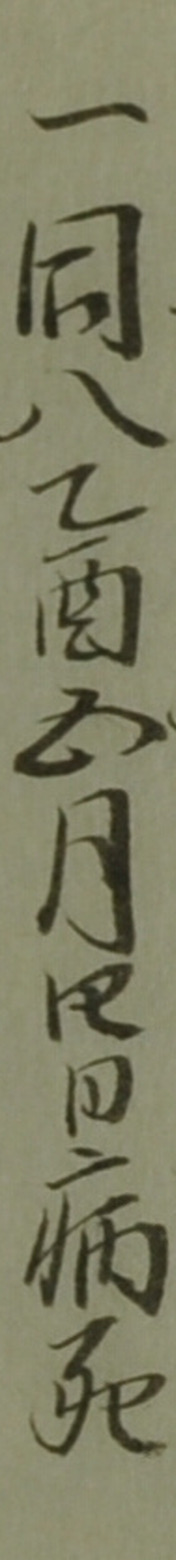一同八乙酉五月四日病死
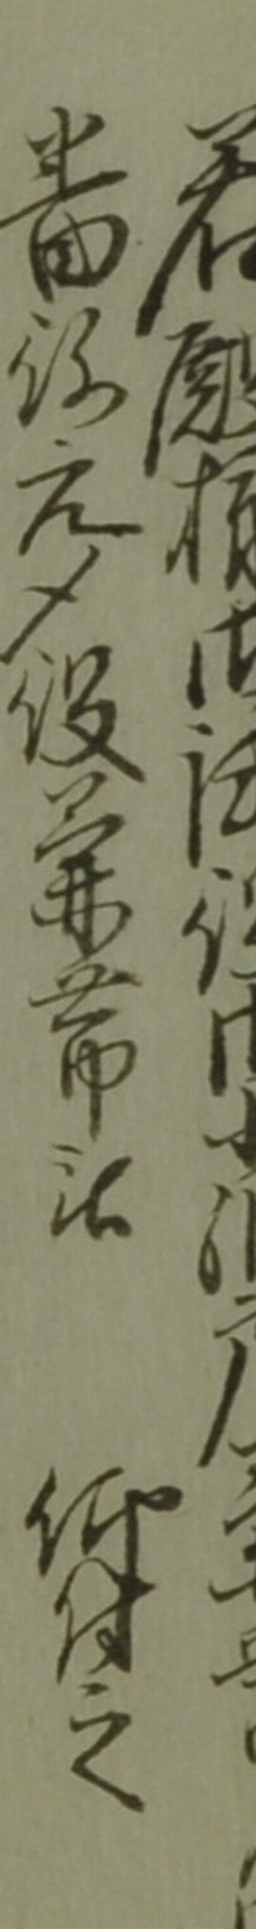番役元〆役兼帯被仰付之
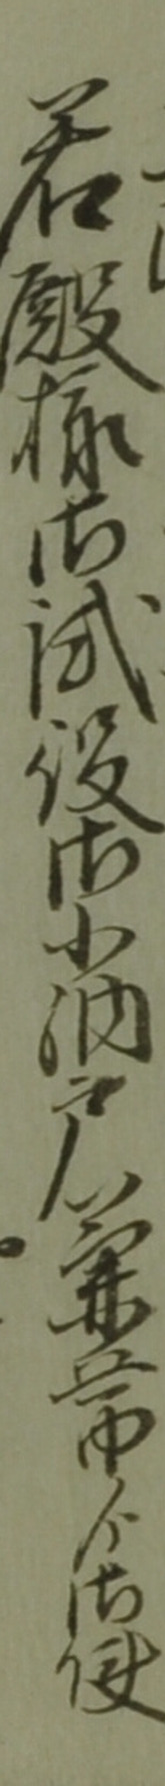若殿様御試役御小納戸兼帯ゟ御使
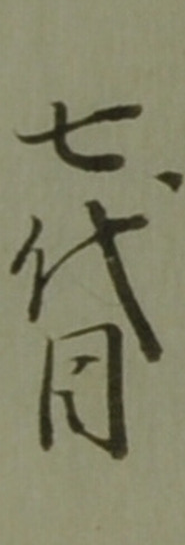七代目
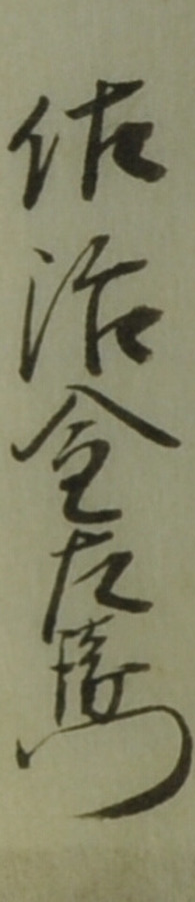佐治金左衛門

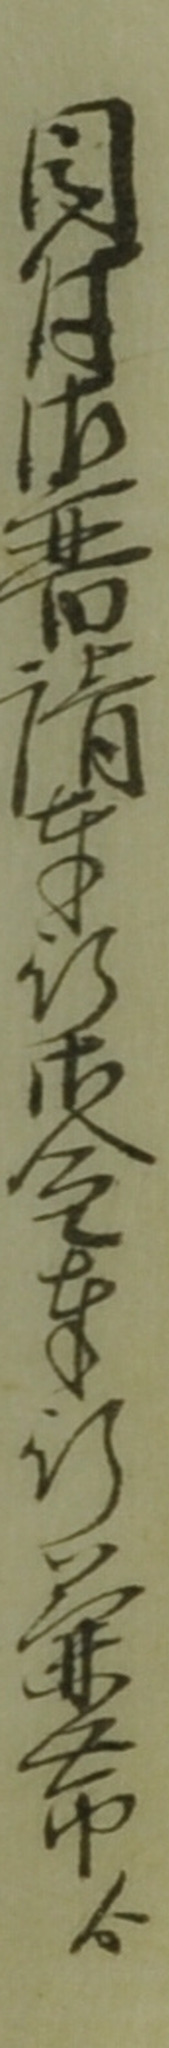目付御普請奉行御金奉行兼帯ゟ
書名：諸御役代々録（七）
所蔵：伊那市立高遠町図書館・合同会社AMANE
